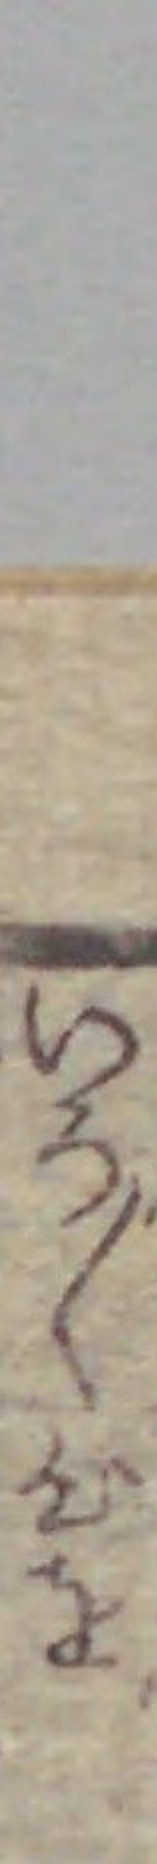いろ〳〵心を
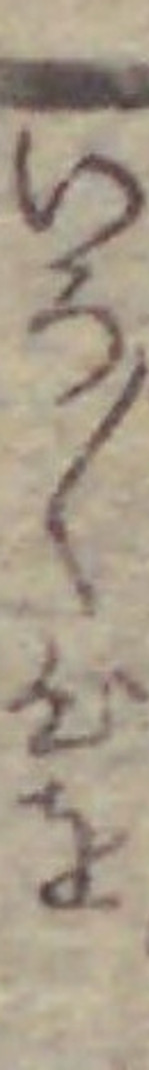いろ〳〵心を
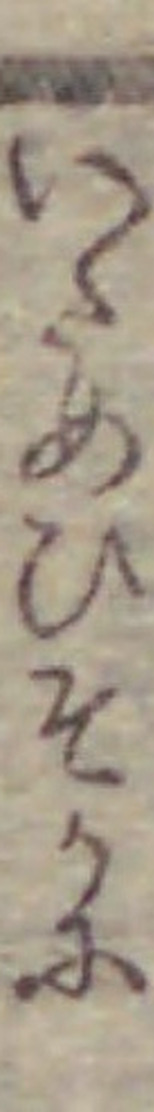いためひそかに
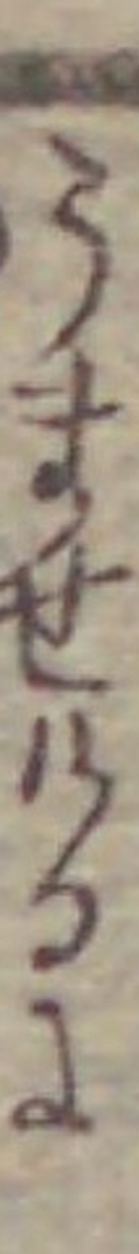うませけるに
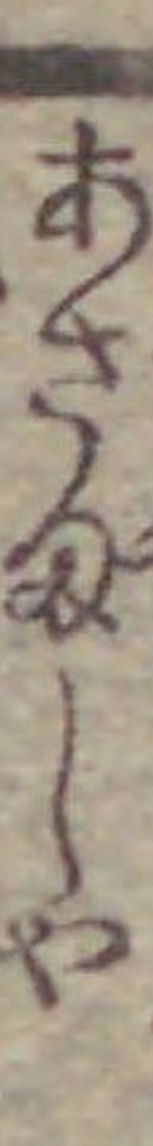あさましや
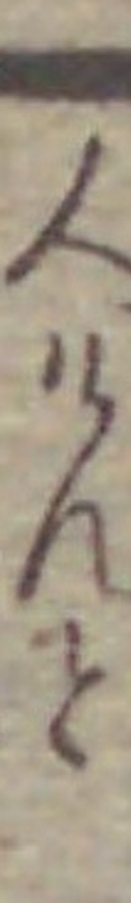人けんと
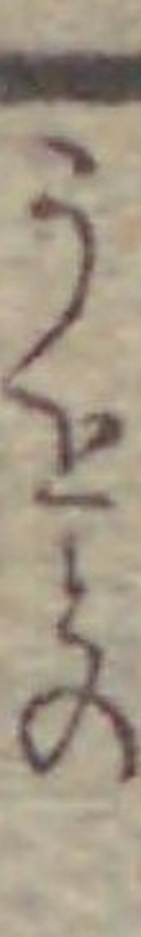うをとの
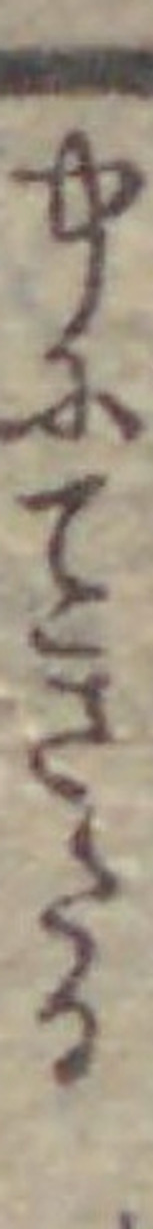中にてきたる
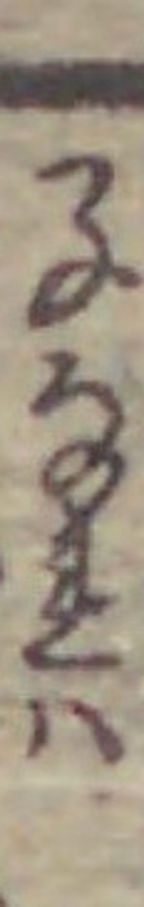子なれは
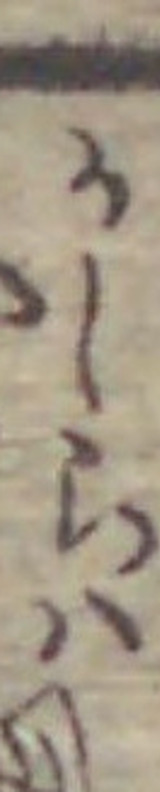かしらは
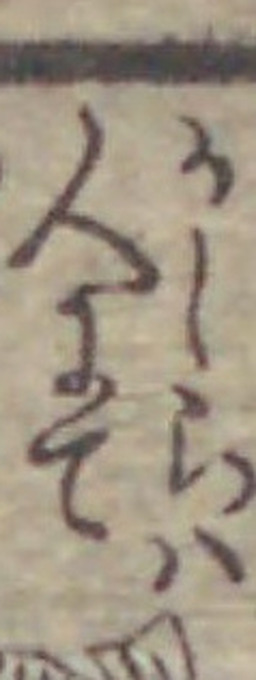人にて
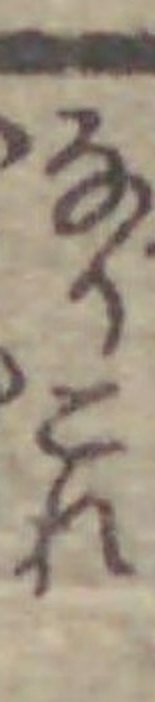なりこれ
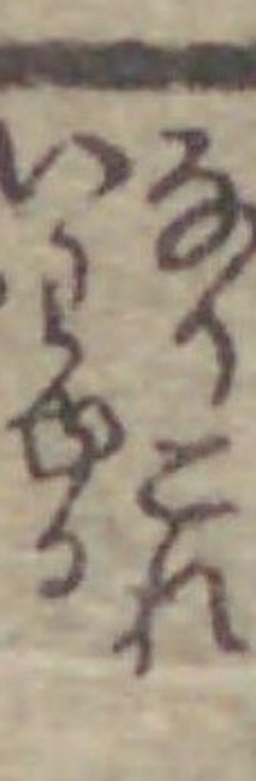いわゆる
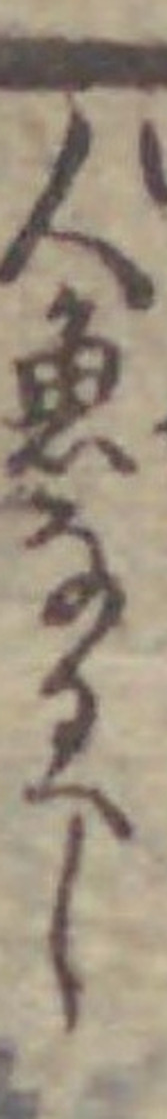人魚なるへし
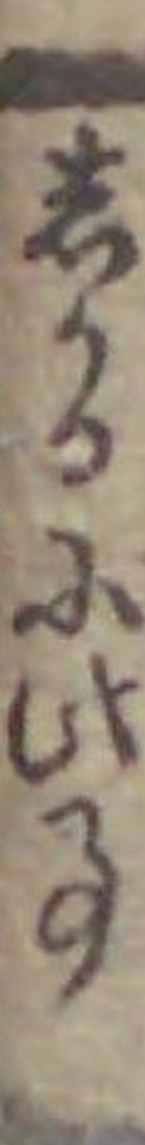しかるに此事
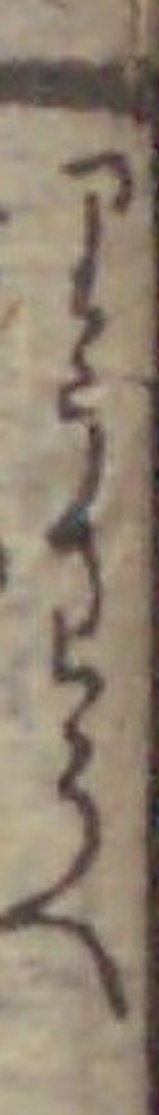りうわうへ
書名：箱入娘面屋人魚 3巻
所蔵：国立国会図書館 National Diet Library, JAPAN
